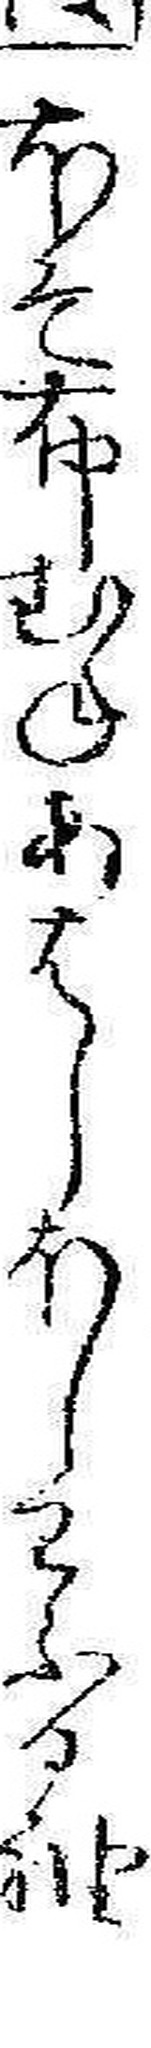ほほそ布むねあはしほしわふる袖
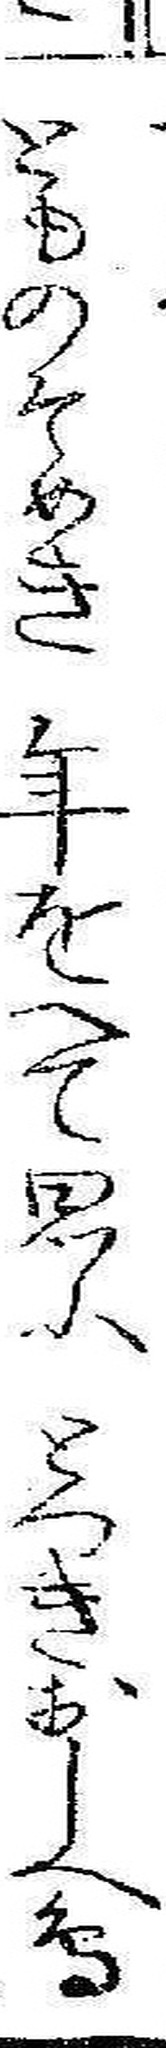ととものそめき年をへて思ふとつきおしへ鳥
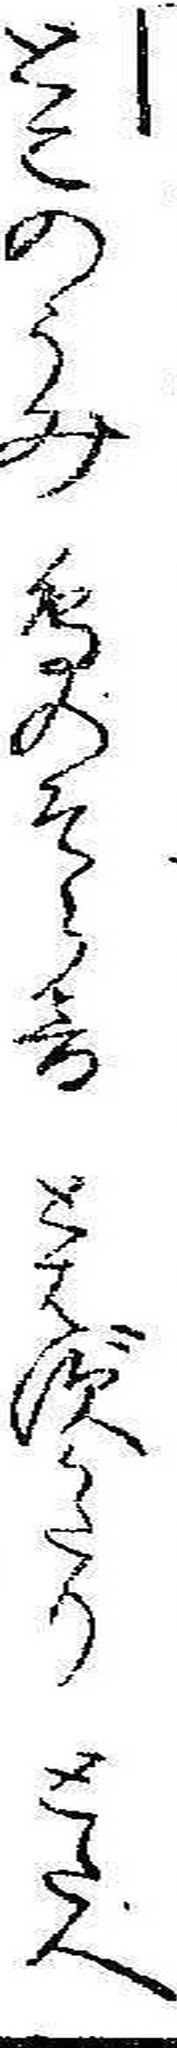とこのうみ鳥のそらの音とはずかたりとたへ
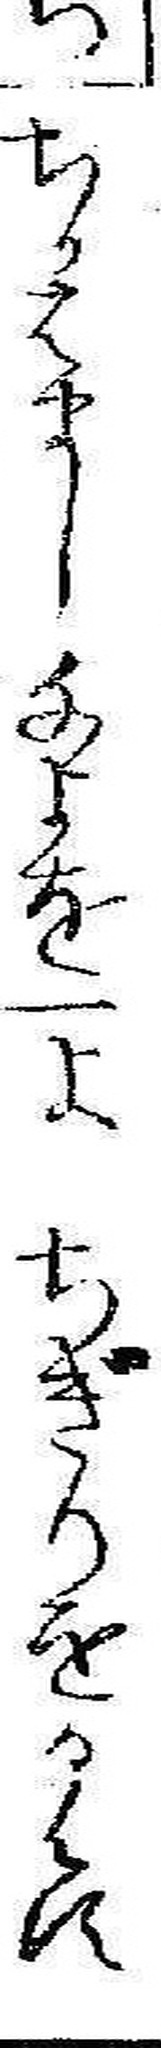ちちりはまし千よを一よちぎりをるはす
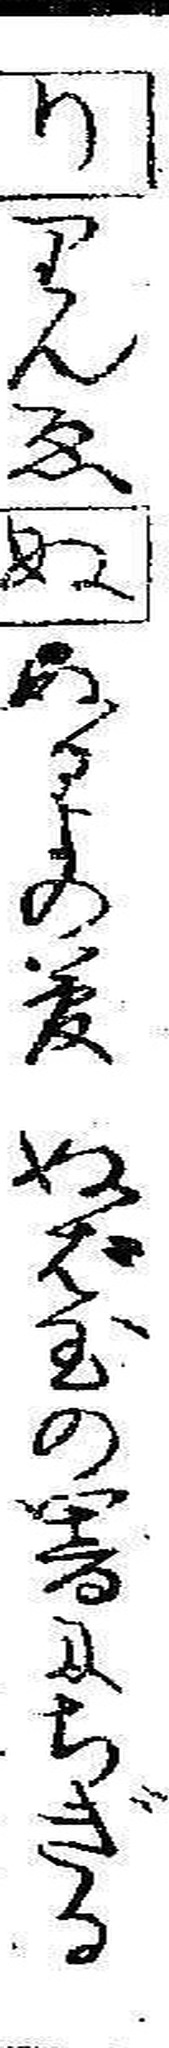りりんゑぬぬるよの夢ぬば玉の闇にちぎる
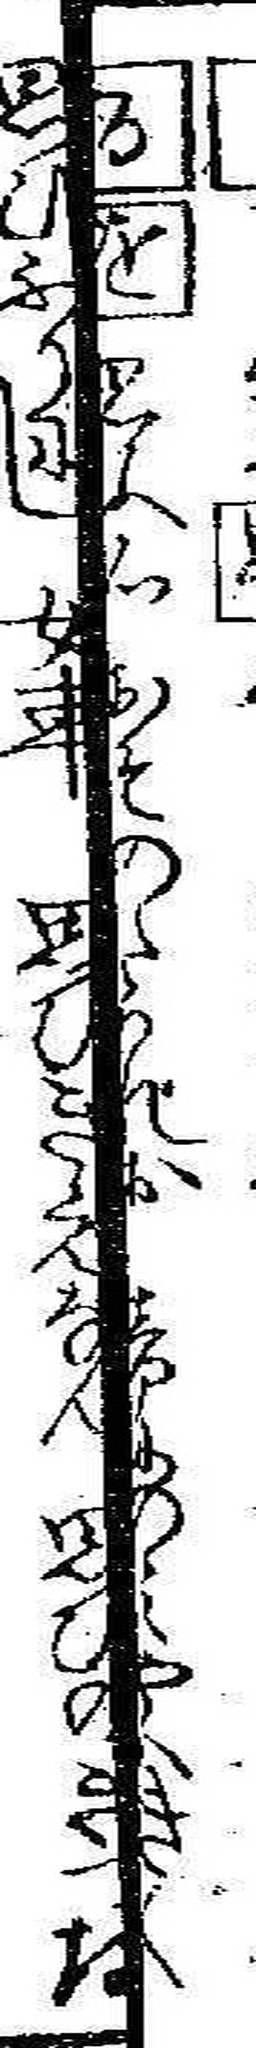思ひふりにし女車思ひきえなん思ひのきつな
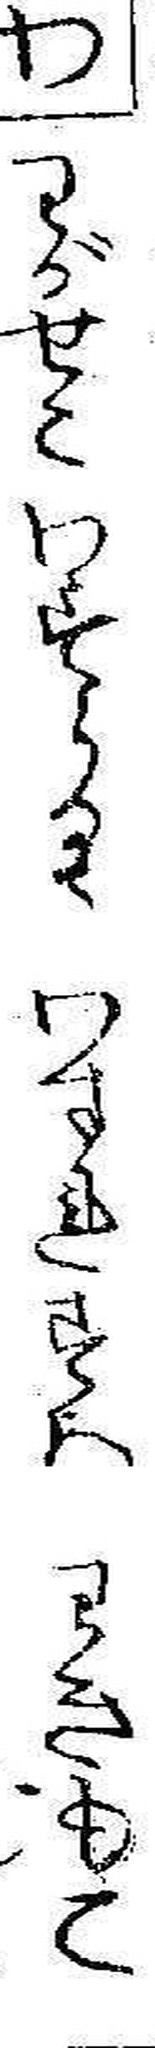わわがせこわすらるゝわすれすはわきもこ
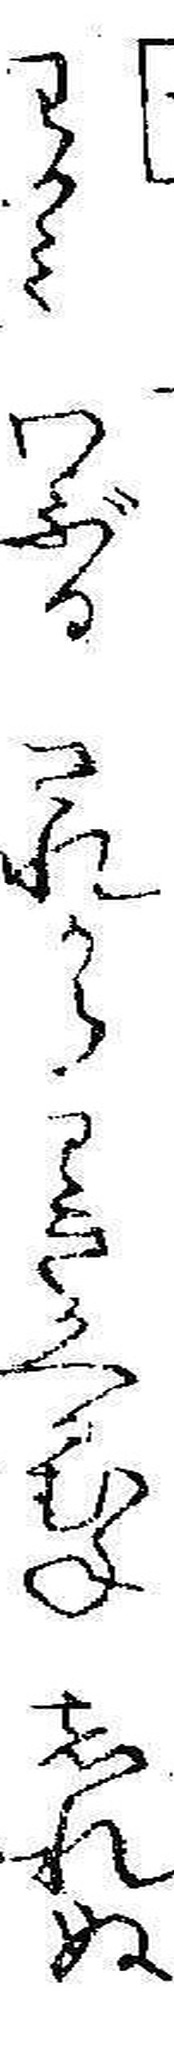わかみわぶるわれからわきかへるむね忘れぬ
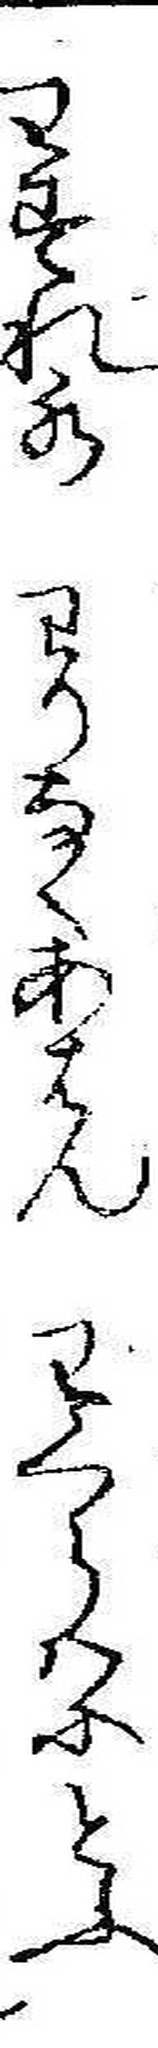わすれ水わりなくあはんわくらはにとふ
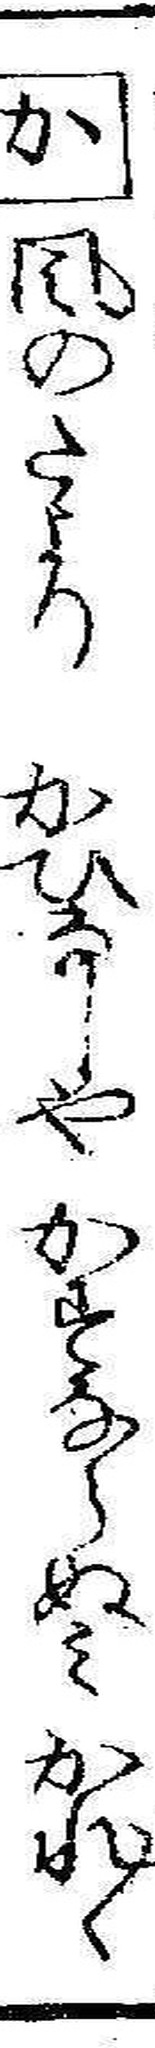か風のたよりかひなしやかすならぬみかれ〳〵
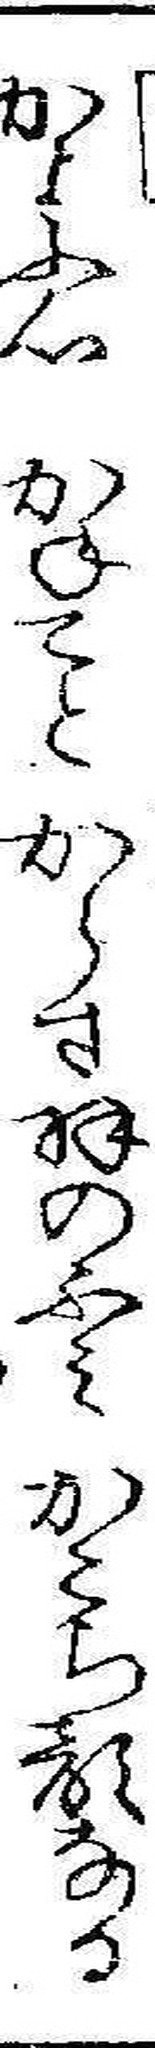かよふ心かねてとからす羽のふみかこち顔なる
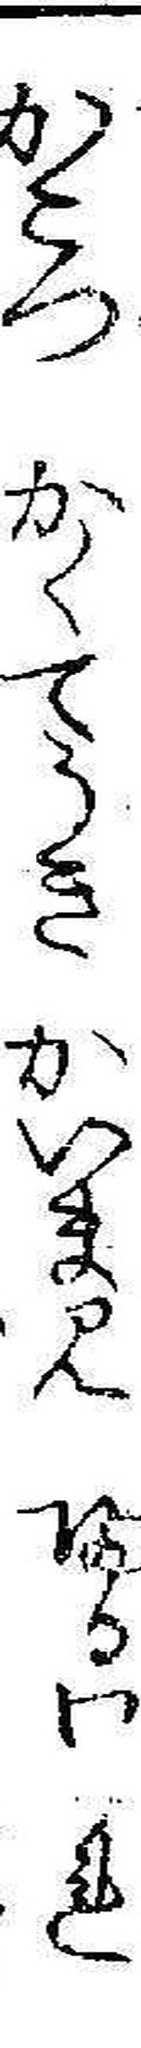かこつかくてうきかいま見よるのちぎり
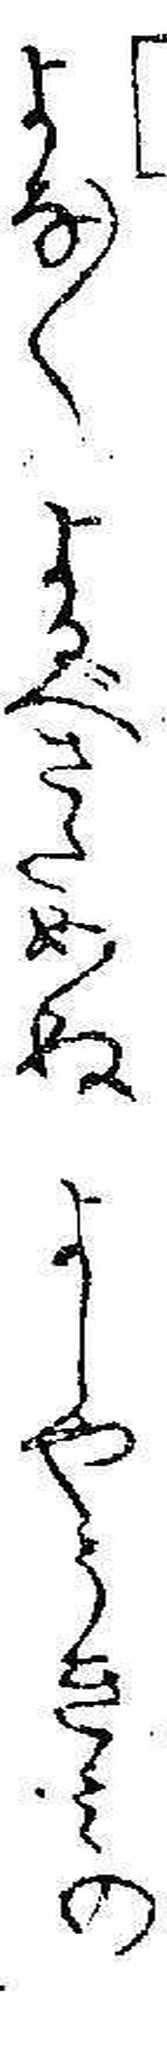よな〳〵よるべさためぬよしやうきみの

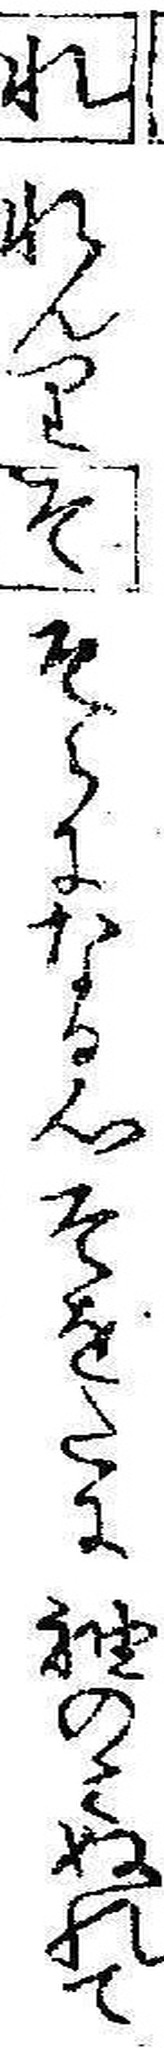れれんりそそらになる心そをたに袖のみぬれて
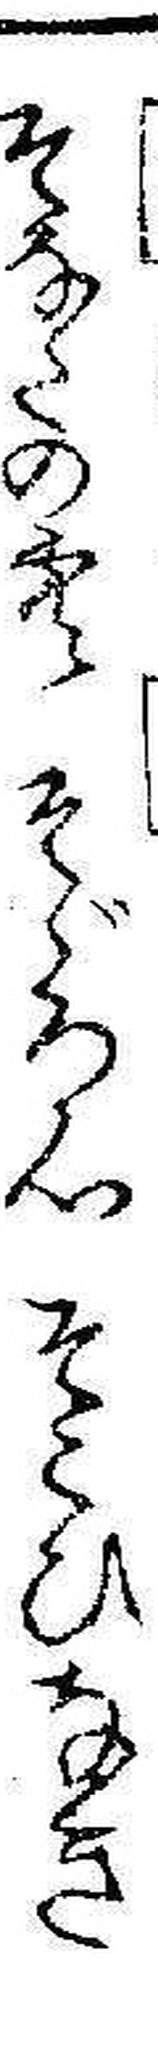そなたの空そゞろ心そこひなき
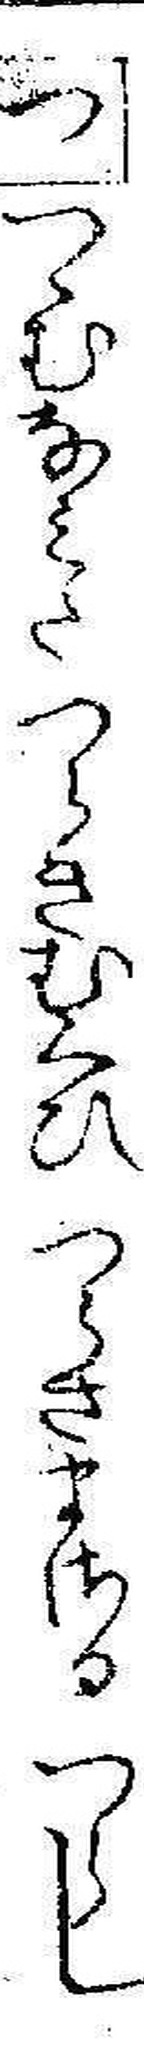つつゝむなみたつらきむくひつらさまさるつらし
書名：狂哥はまのきさご
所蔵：国文学研究資料館
